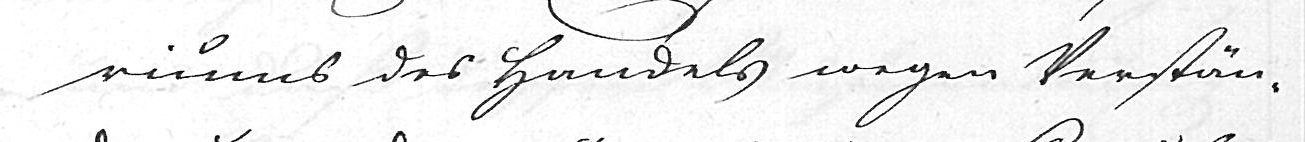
riums des Handels wegen Verstän-
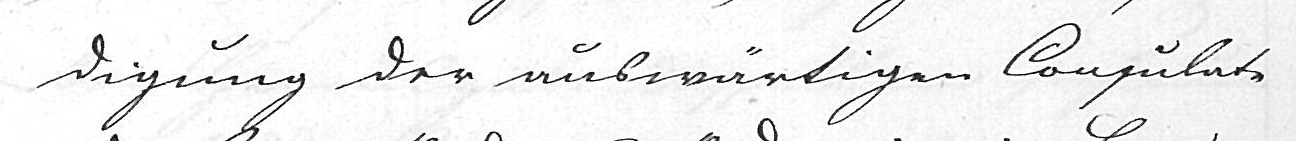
digung der auswärtigen Consulate
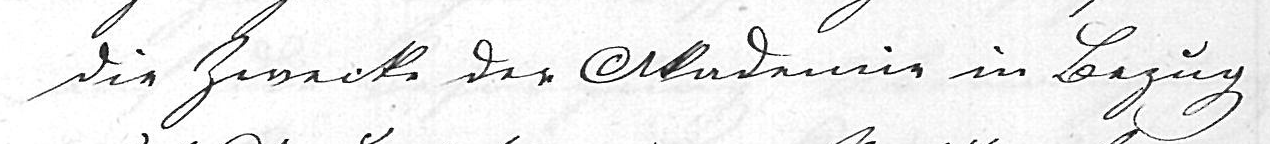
die Zwecke der Akademie in Bezug
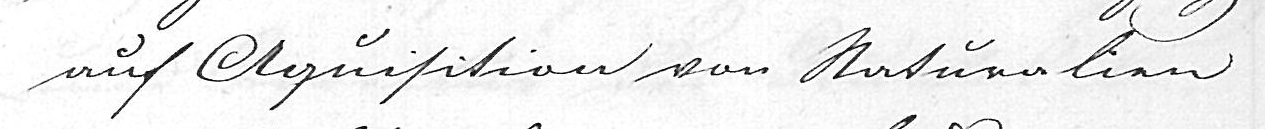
auf Aquisition von Naturalien
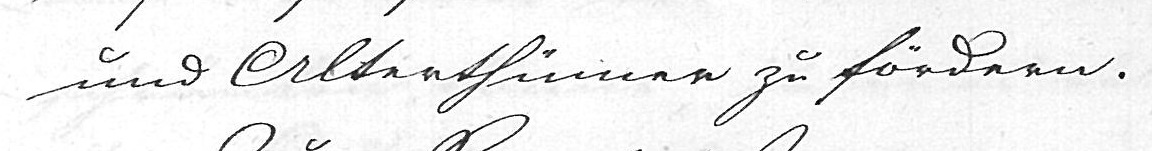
und Alterthümer zu fördern.
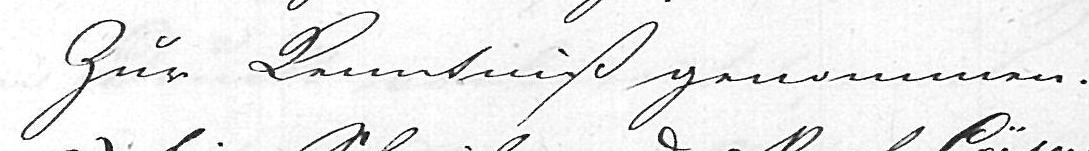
Zur Kenntniß genommen.
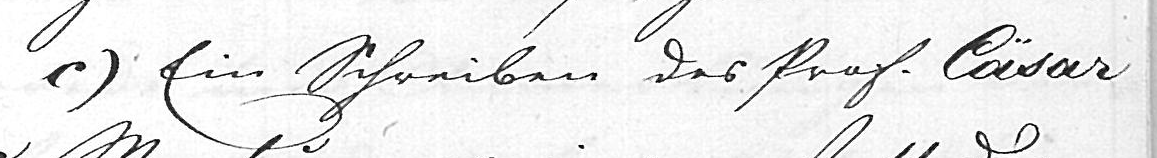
c) Ein Schreiben des Prof. Cäsar
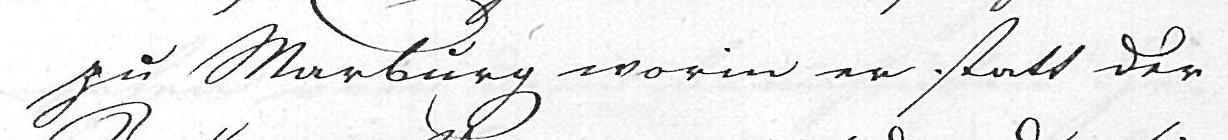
zu Marburg worin er statt der
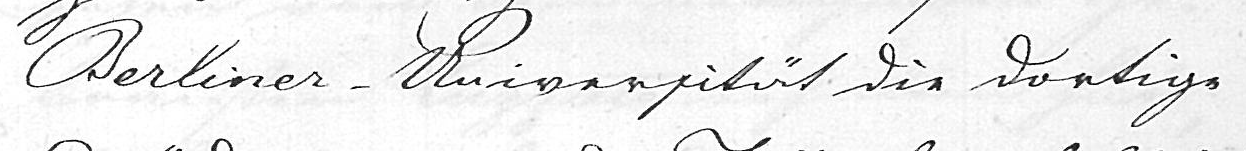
Berliner Universität die dorlige
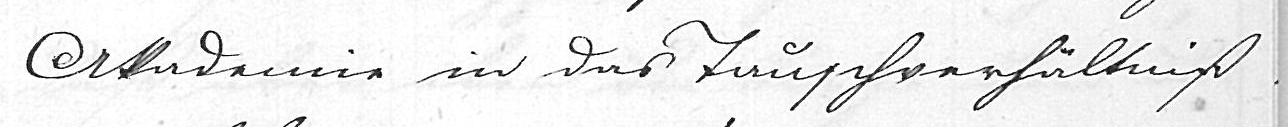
Akademie in das Tauschverhältniß
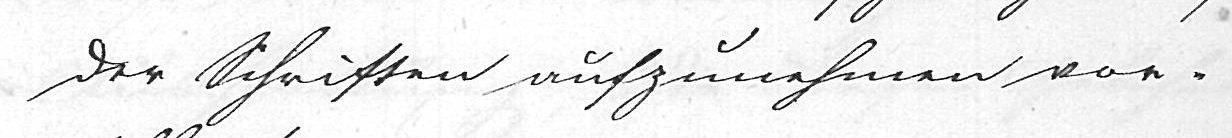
der Schriften aufzunehmen vor-
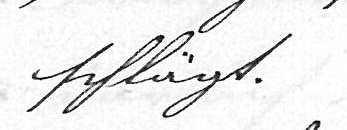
schlägt.
